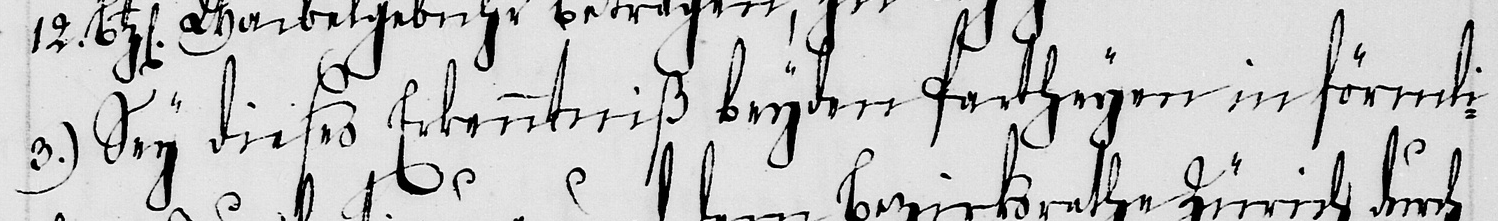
3.) Sey dieses Erkenntniß beyden Partheyen in förmli¬
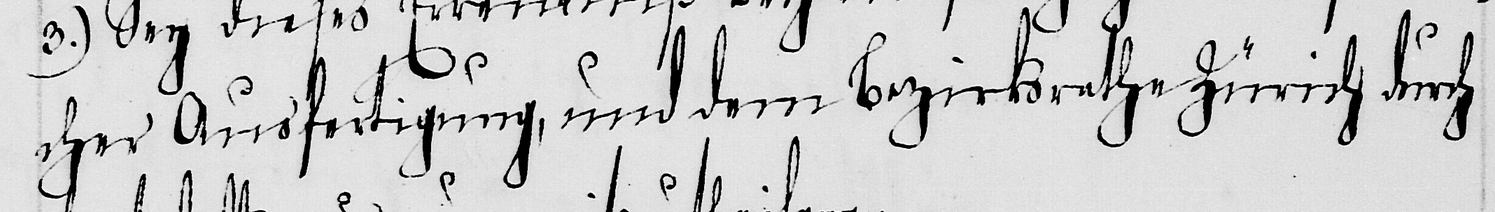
cher Ausfertigung, und dem Bezirksrathe Zürich durch
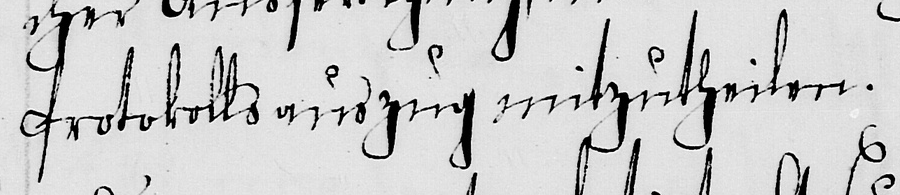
Protokollsauszug mitzutheilen.
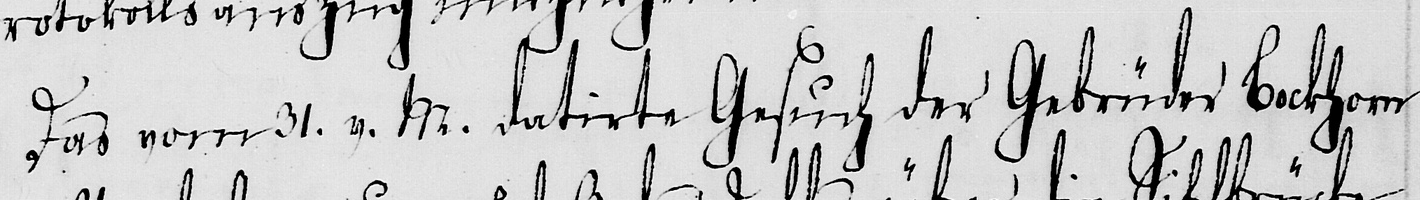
Das vom 31. v. M. datirte Gesuch der Gebrüder Bockhorn
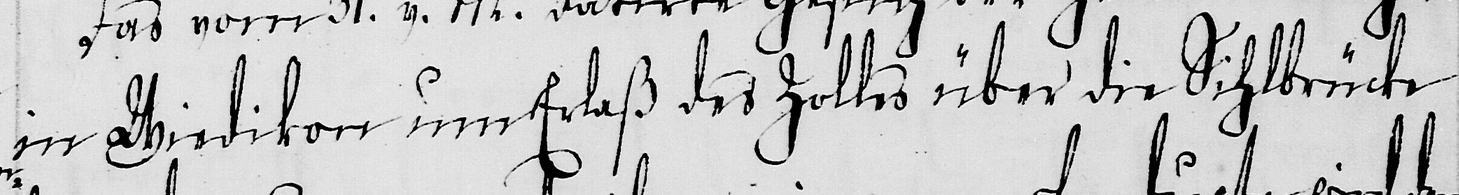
in Wiedikon um Erlaß des Zolles über die Sihlbrücke
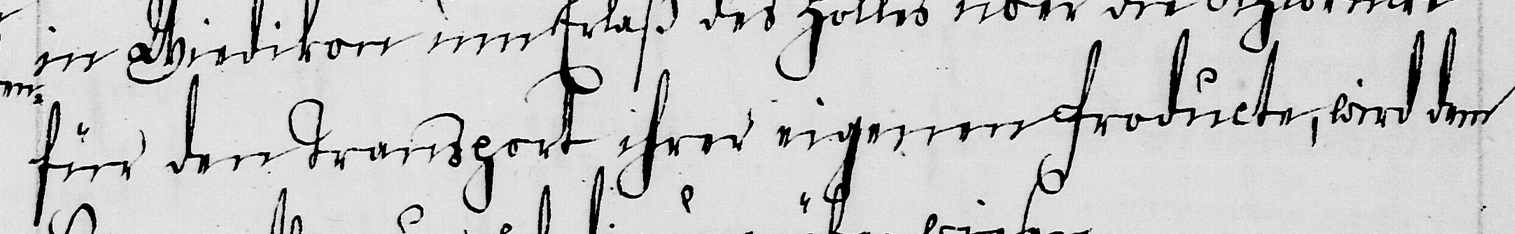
für den Transport ihrer eigenen Producte, wird dem
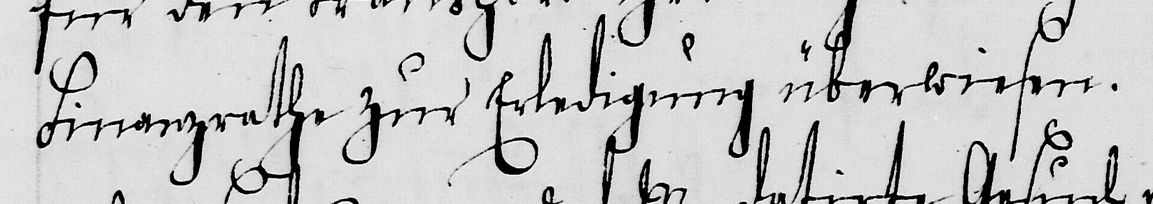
Finanzrathe zur Erledigung überwiesen.
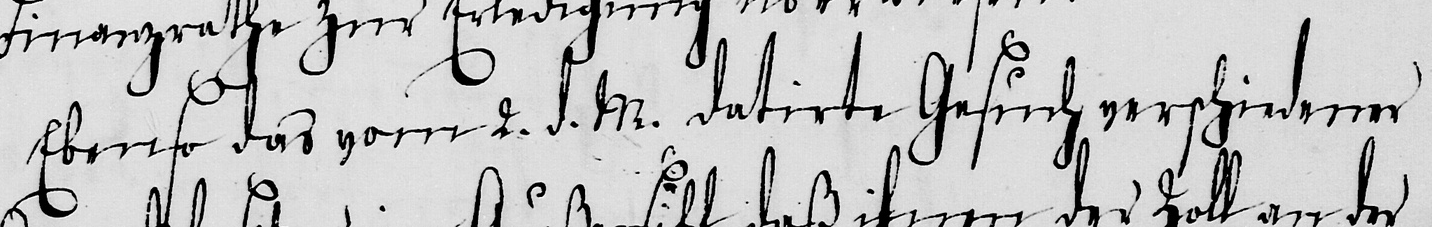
Ebenso das vom 2. d. M. datirte Gesuch verschiedener
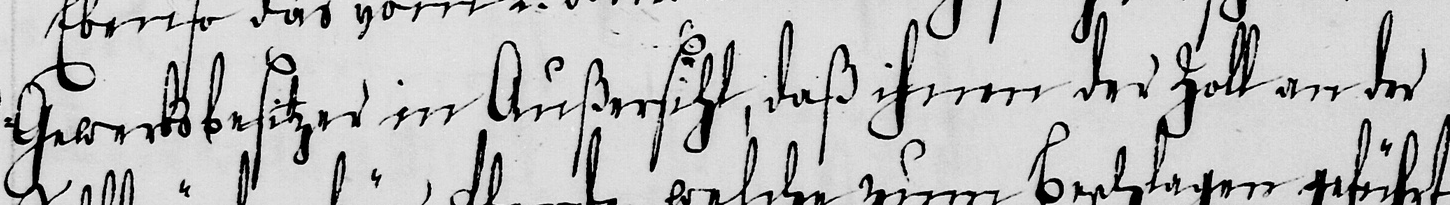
Gewerbsbesitzer in Außersihl, daß ihnen der Zoll an der
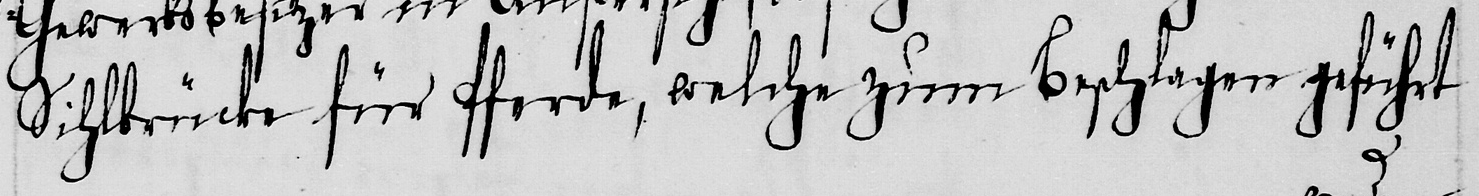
Sihlbrücke für Pferde, welche zum Beschlagen geführt
